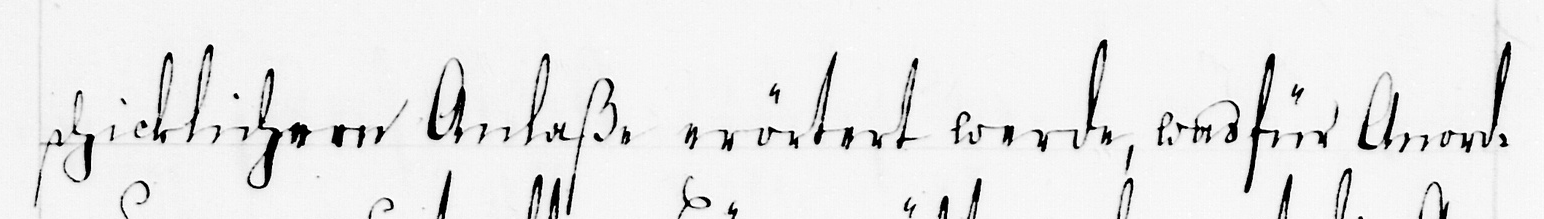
schicklichem Anlaße erörtert werde, was für Anord¬
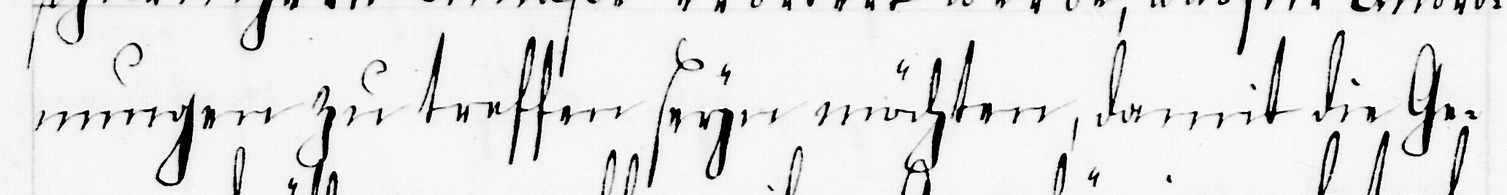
nungen zu treffen seyn möchten, damit die Ge¬
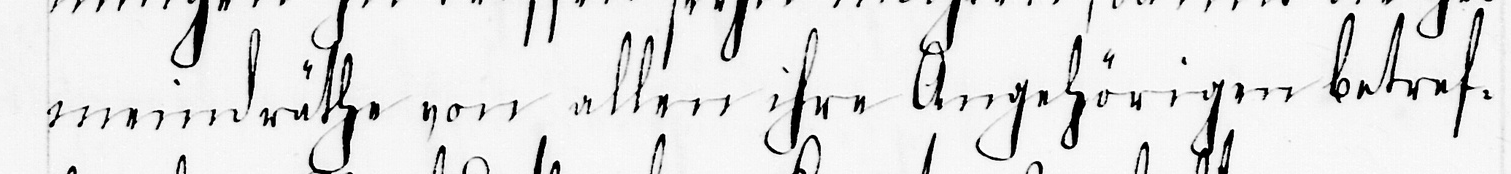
meindräthe von allen ihre Angehörigen betref¬
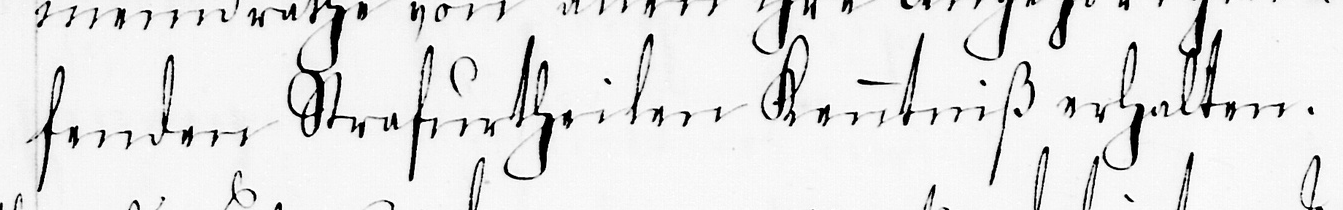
fenden Strafurtheilen Kenntniß erhalten.
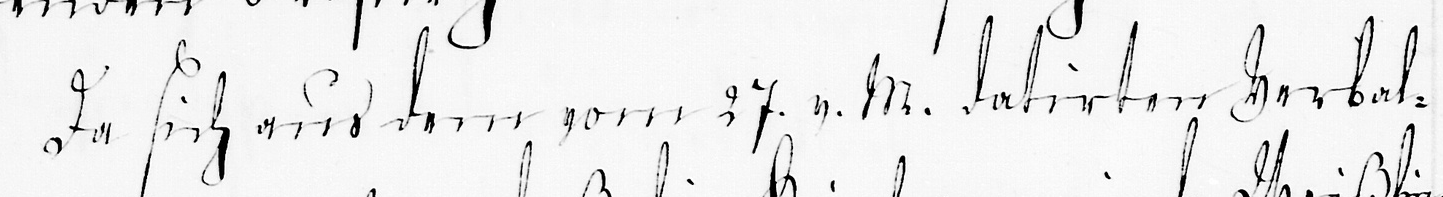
Da sich aus dem vom 27. v. M. datirten Verbal¬
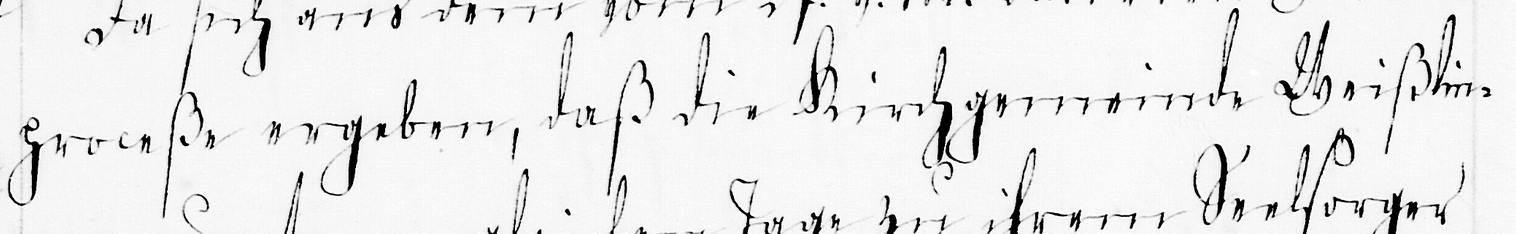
proceße ergeben, daß die Kirchgemeinde Weißlin¬
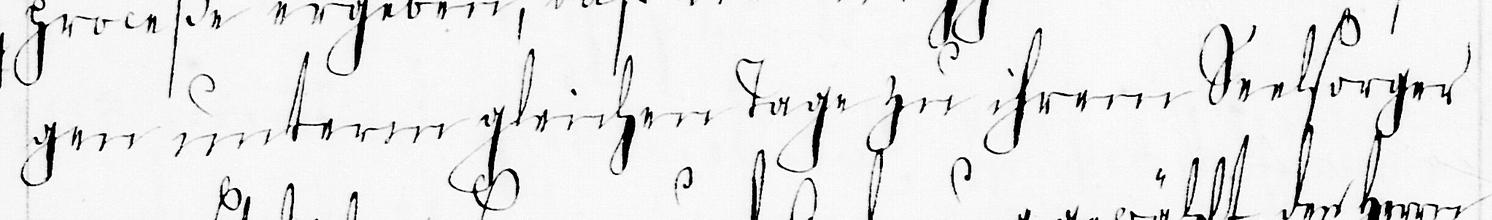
gen unterm gleichen Tage zu ihrem Seelsorger
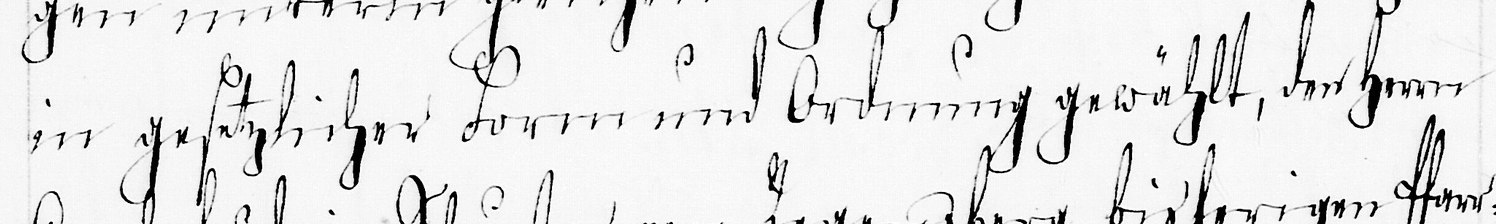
in gesetzlicher Form und Ordnung gewählt, den Herrn
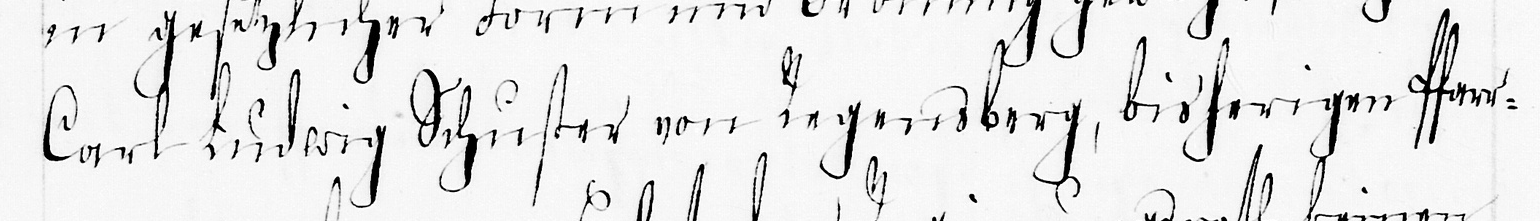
Carl Ludwig Schuster von Regensberg, bisherigen Pfar¬
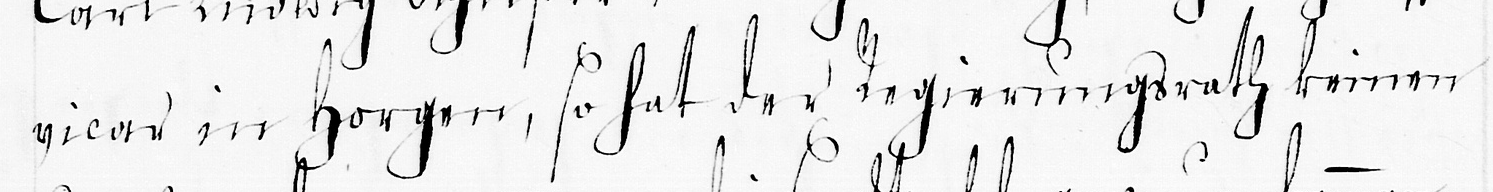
rvicar in Horgen, so hat der Regierungsrath keinen
